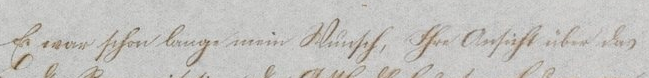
Es war schon lange mein Wunsch, Ihre Ansicht über das
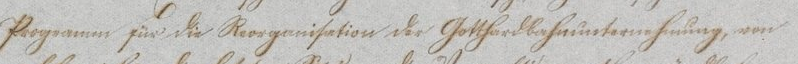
Programm für die Reorganisation der Gotthardbahnunternehmung, von
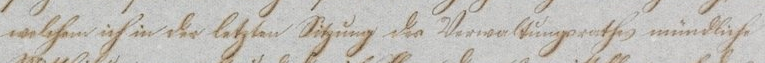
welchem ich in der letzten Sitzung des Verwaltungsrathes mündliche
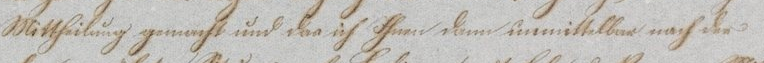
Mittheilung gemacht und das ich Ihnen dann unmittelbar nach der
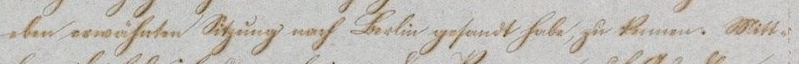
eben erwähnten Sitzung nach Berlin gesandt habe, zu kennen. Mitt-
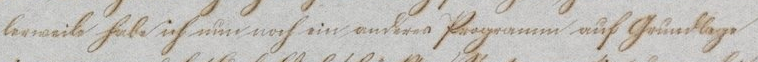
lerweile habe ich nun noch ein anderes Programm auf Grundlage
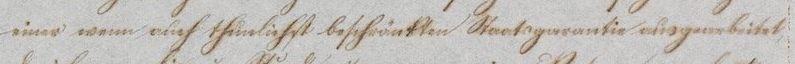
einer wenn auch thunlichst beschränkten Staatsgarantie ausgearbeitet,
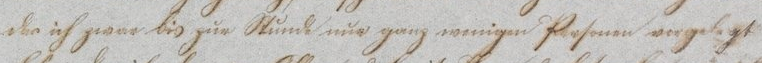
das ich zwar bis zur Stunde nur ganz wenigen Personen vorgelegt
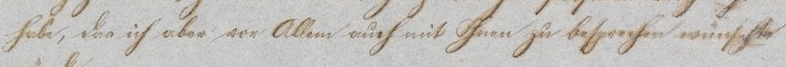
habe, das ich aber vor Allem auch mit Ihnen zu besprechen wünschen
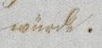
würde.
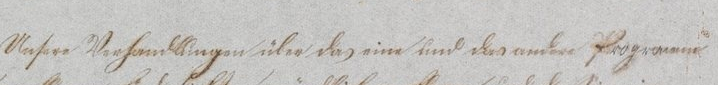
Unsere Verhandlungen über das eine und das andere Programm
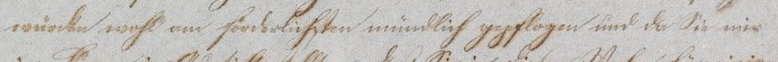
würden wohl am förderlichsten mündlich gepflogen und da Sie mir
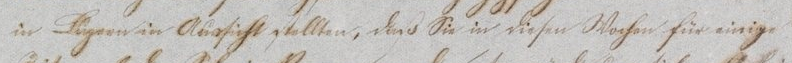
in Luzern in Aussicht stellten, daß Sie in diesen Wochen für einige
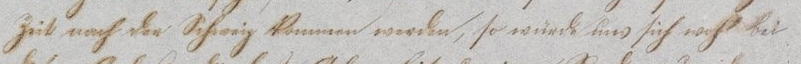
Zeit nach der Schweiz kommen werden, so würde uns sich wohl bei
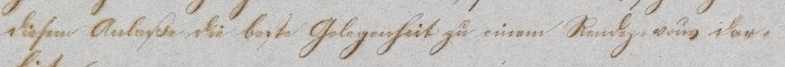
diesem Anlaße die beste Gelegenheit zu einem Rendez-vous dar-
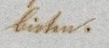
bieten.
